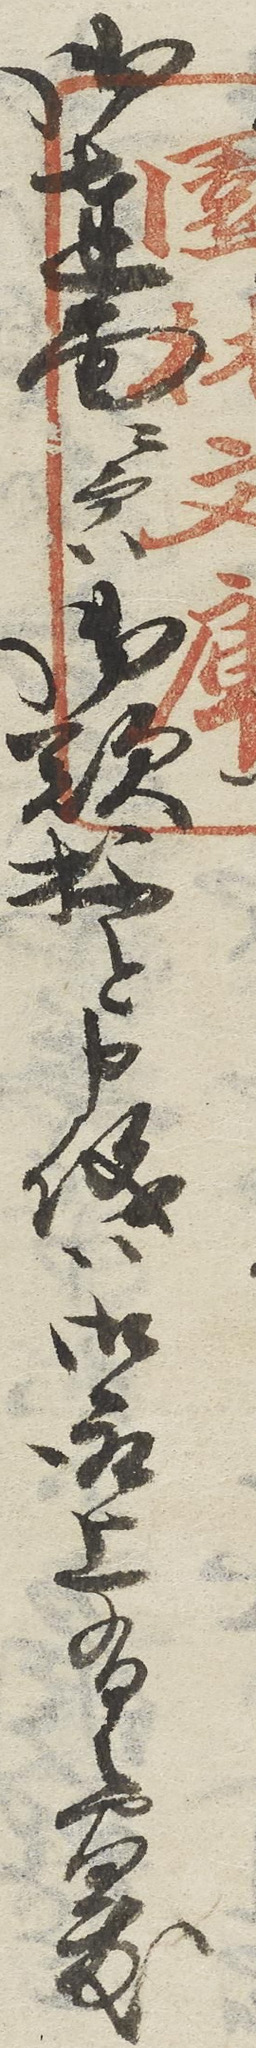御達面二而ハ御歎抔と申儀ハ御取上有之間敷
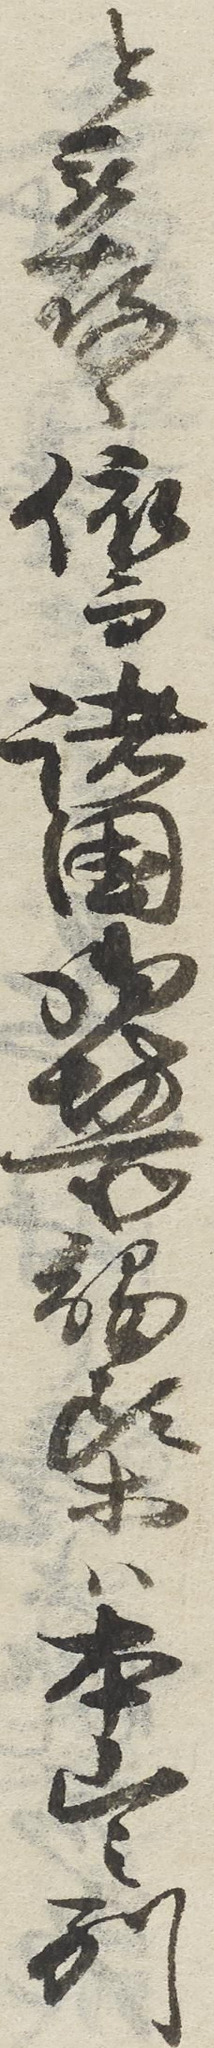と罷存候依而諸国御坊所錫頭等ハ本山之別
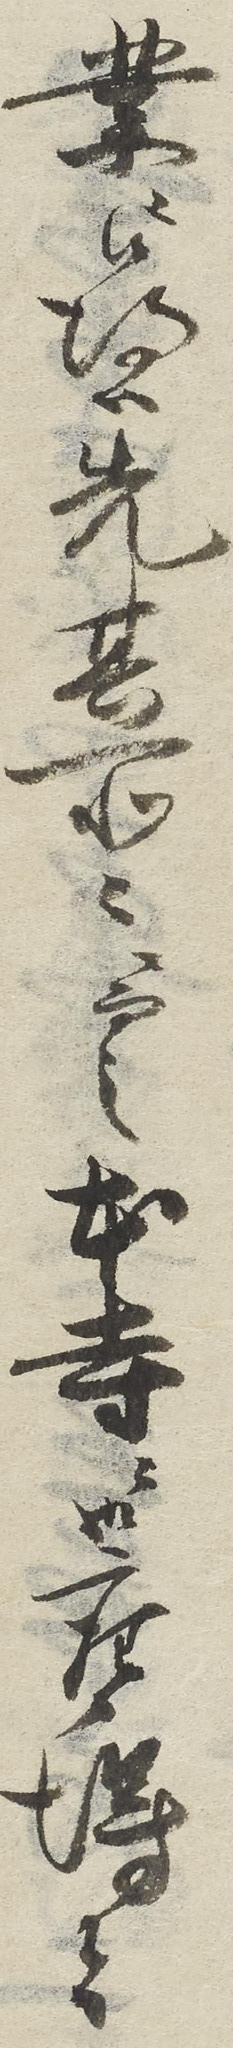業二候得は先其所々二而之本寺二御座候得は
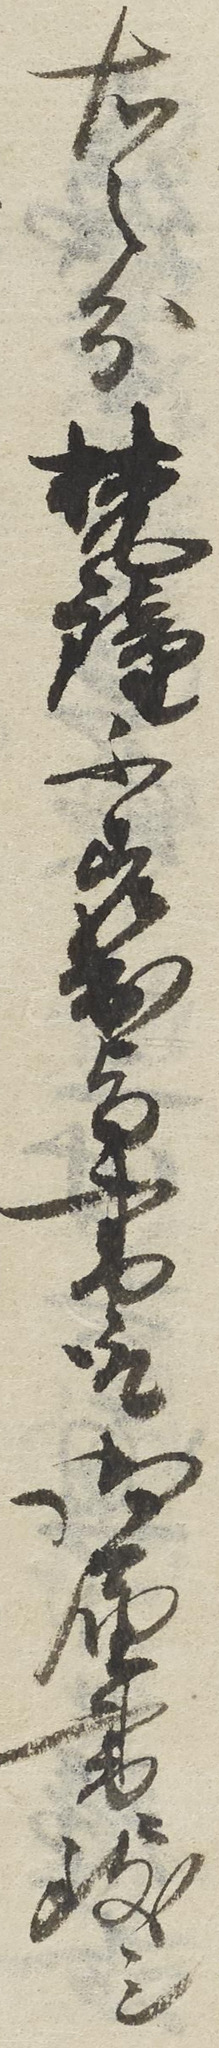右之分梵鐘不差出旨書取御届書二致ㇱ
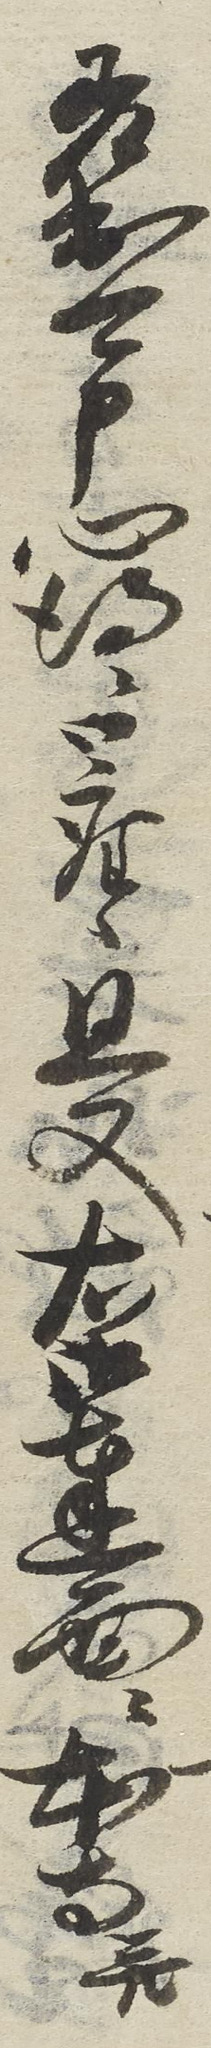差出可申心得二御座候且又右御達面二本寺并
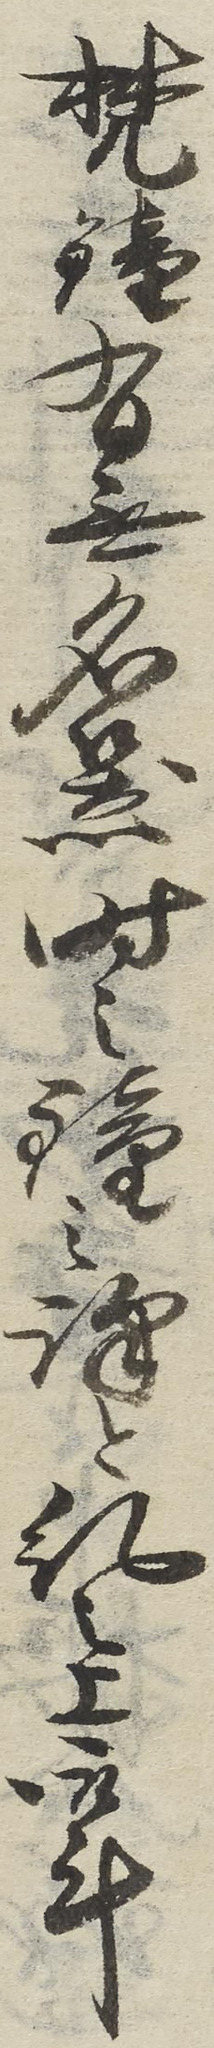梵鐘有無名器時之鐘之譯と糺之上取斗
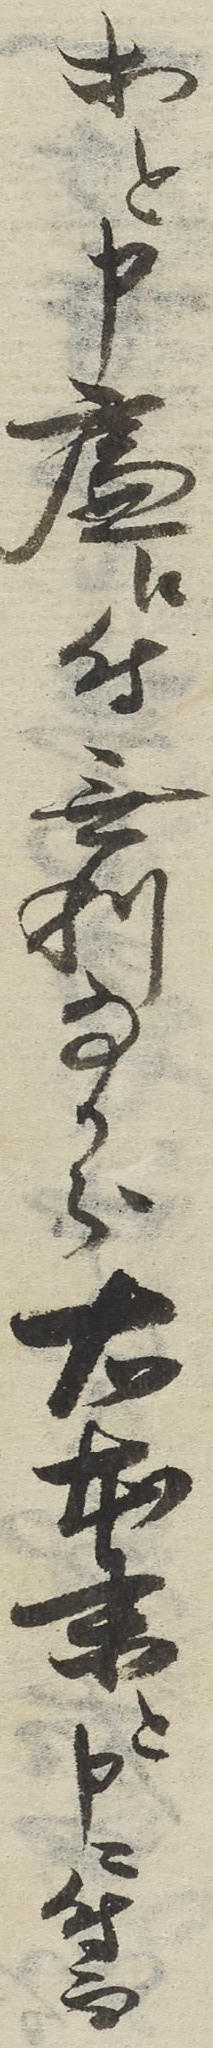等と申廉江付無利なから右本寺と申二付而

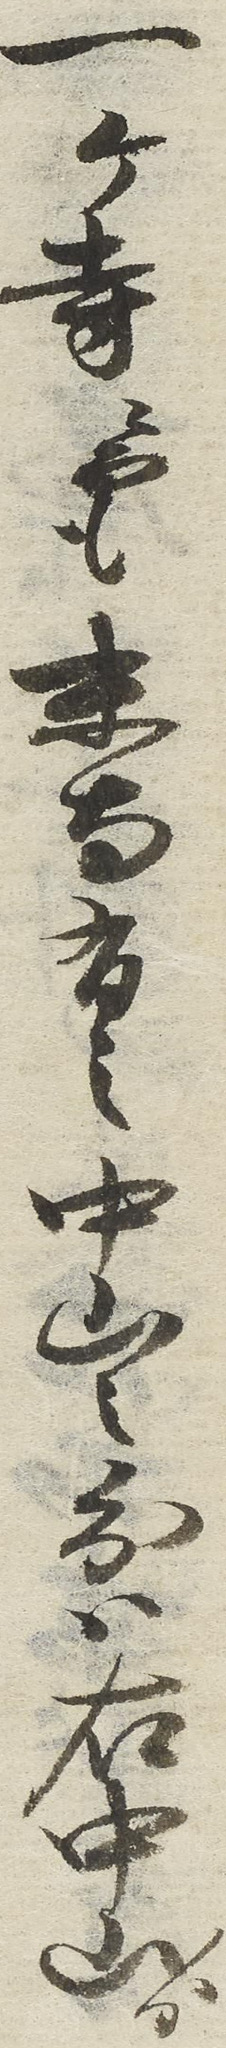一ヶ寺二而も末寺有之中山之分ハ右中山ゟ
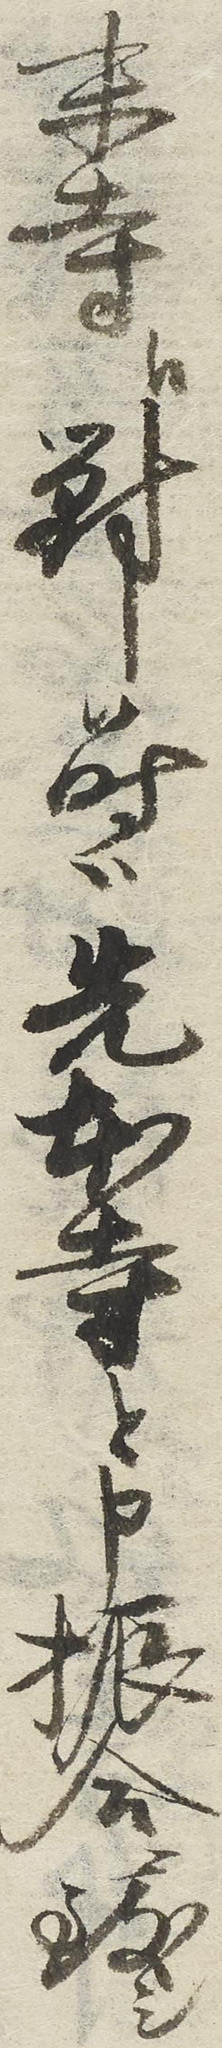末寺江対し候時ハ先本寺と申振合二致ㇱ
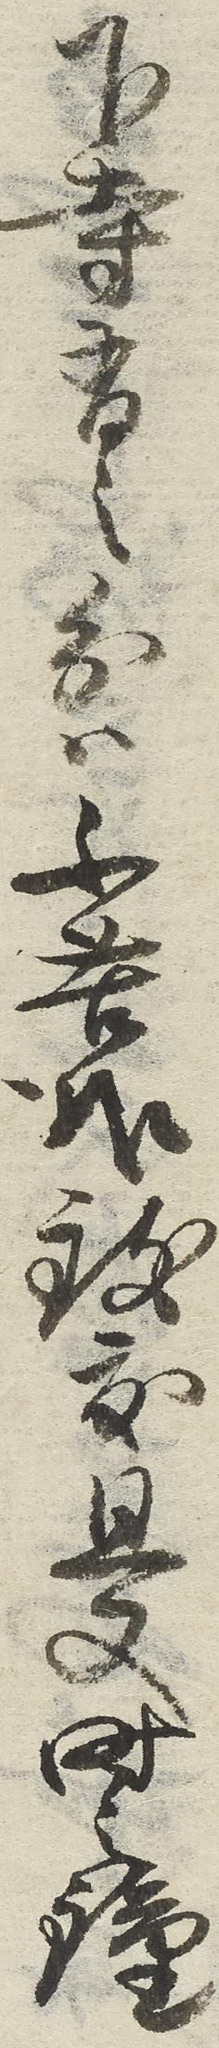下寺有之分ハ不苦様致度且又時之鐘
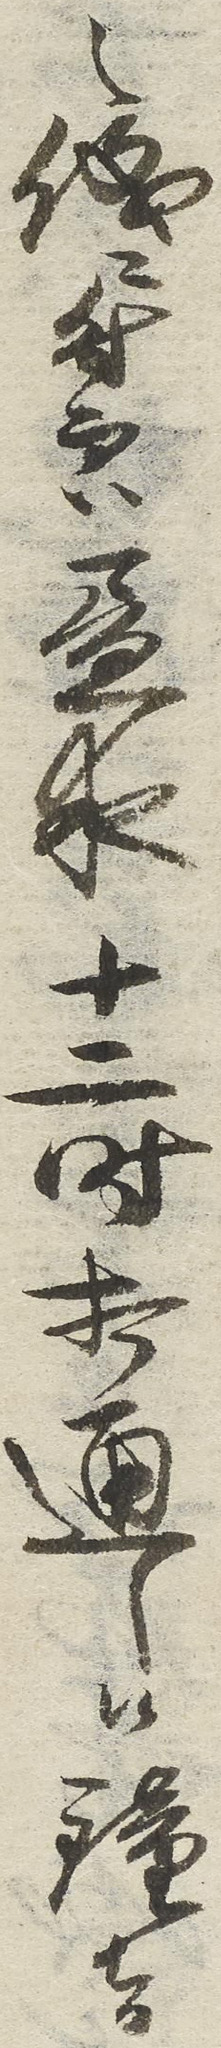之儀二付而ハ昼夜十二時打通し候鐘は
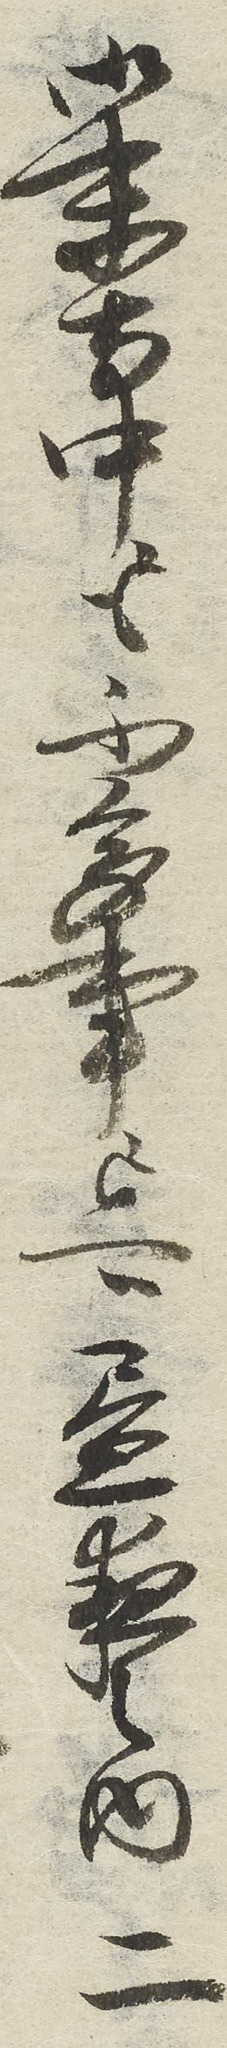御末寺中二も不多事二候へハ昼夜之内二
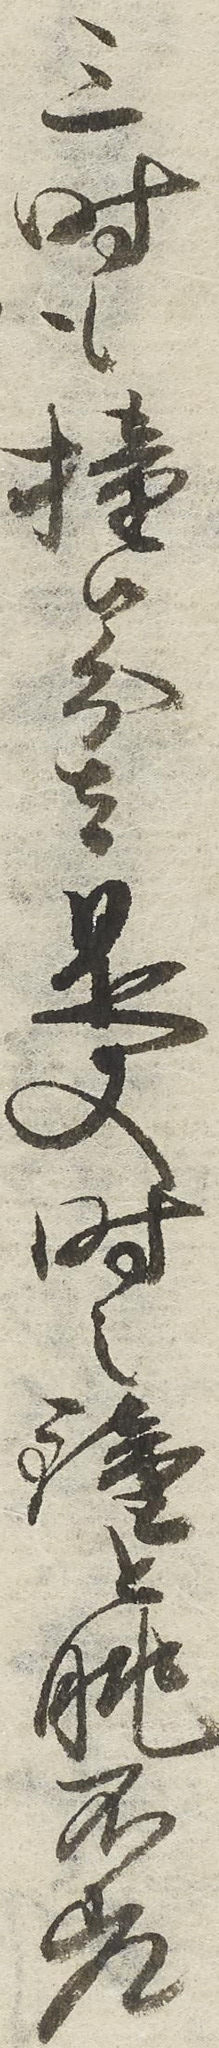三時も撞候分は是又時之鐘と眺不差
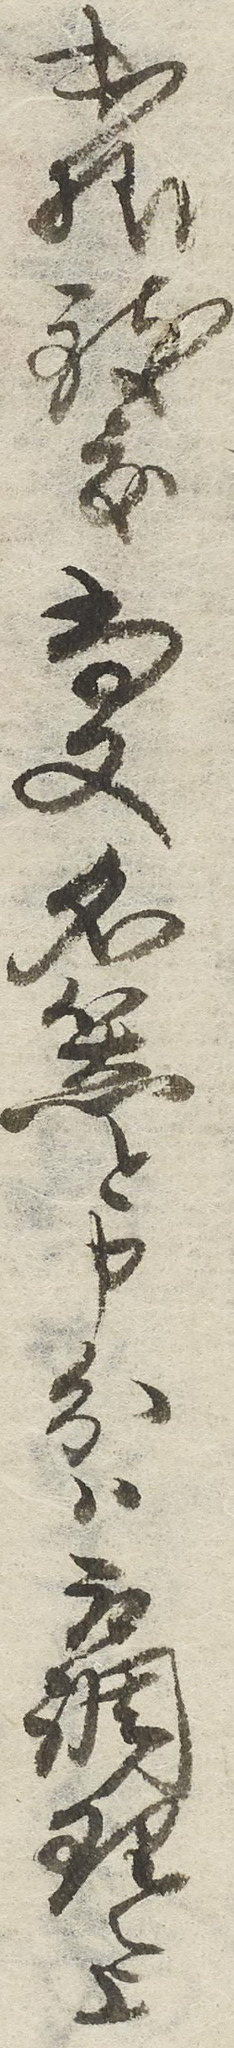出様致度尚又名器と申分ハ取調理之上
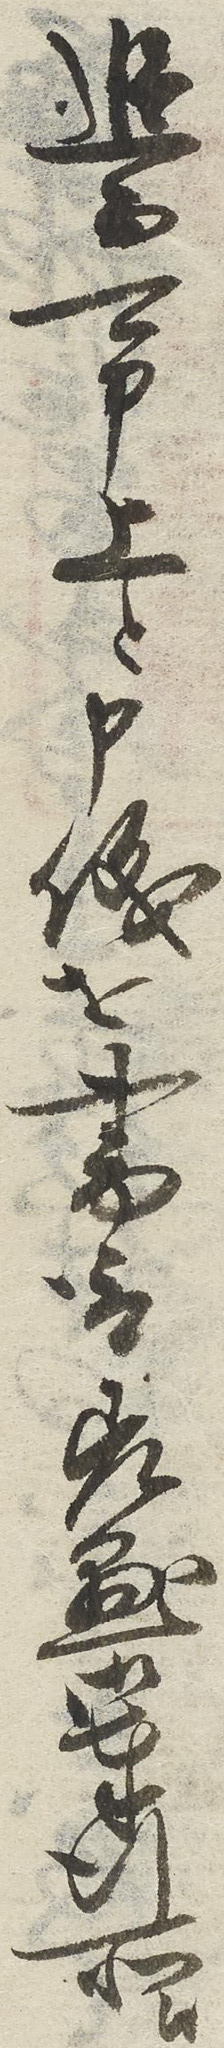追而可申上と申儀を書取差懸御奉行所江
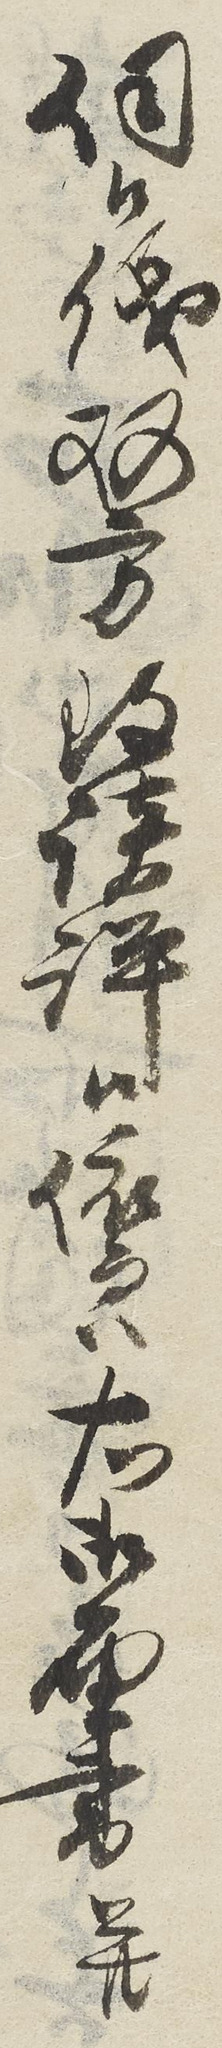伺候儀双方致談評候依而ハ右御届書并
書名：[梵鐘差出一件]
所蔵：東京大学地震研究所図書室 Earthquake Research Institute Library, The University of Tokyo, JAPAN
